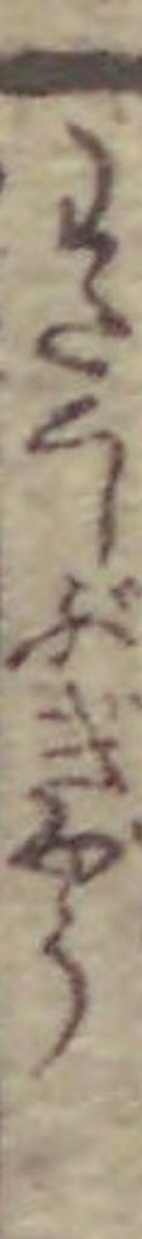わたくしぶぎやう
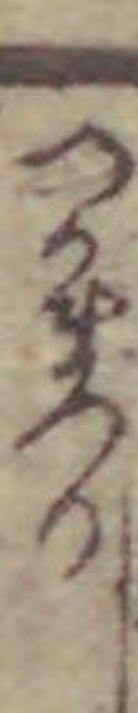つかまつり
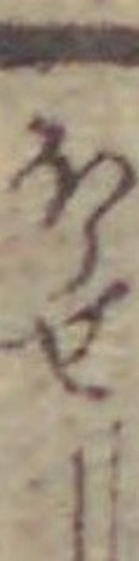ほらせ
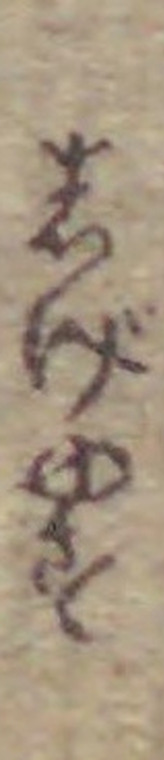しげやす
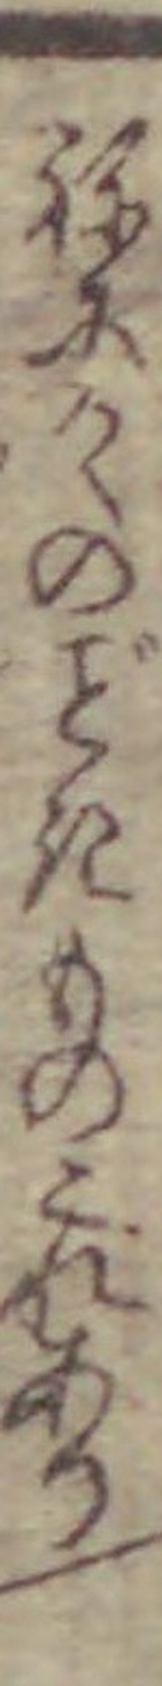ねにかくのごときものこれあり
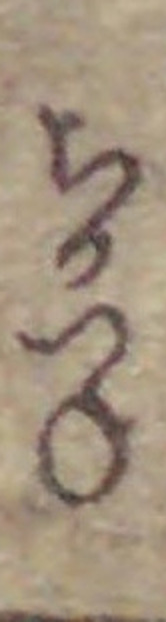ちかつね
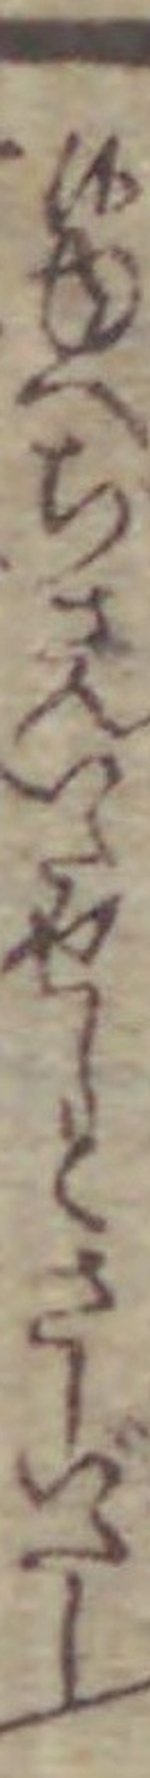候ゆへぢさんいたせしとさしいだし
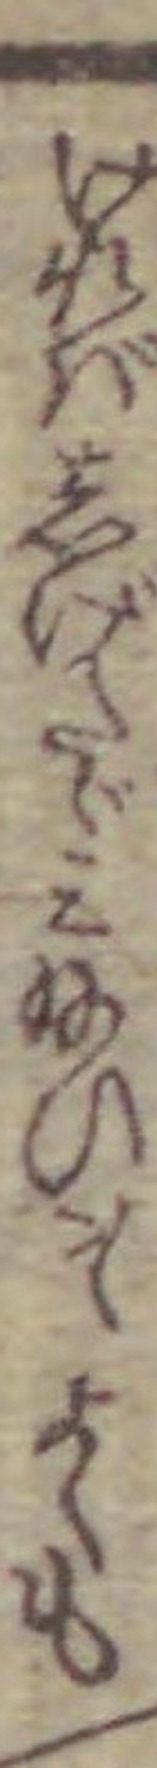ければしげたゞみ給ひてよくも
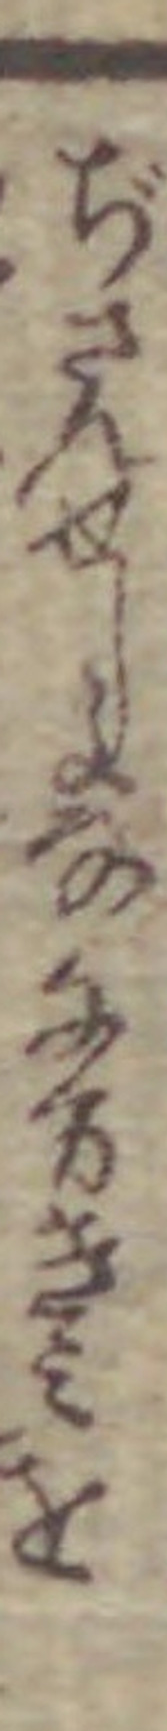ぢさんせしよな千万きみを
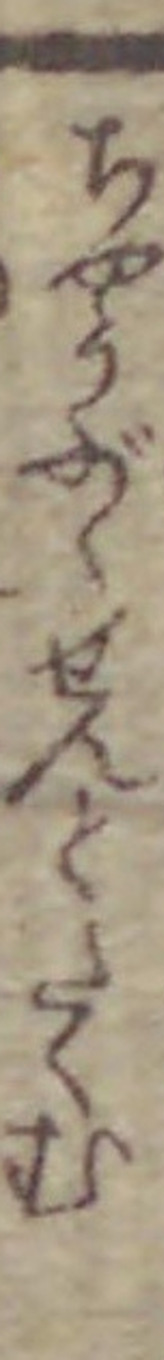ちやうぶくせんとたくむ
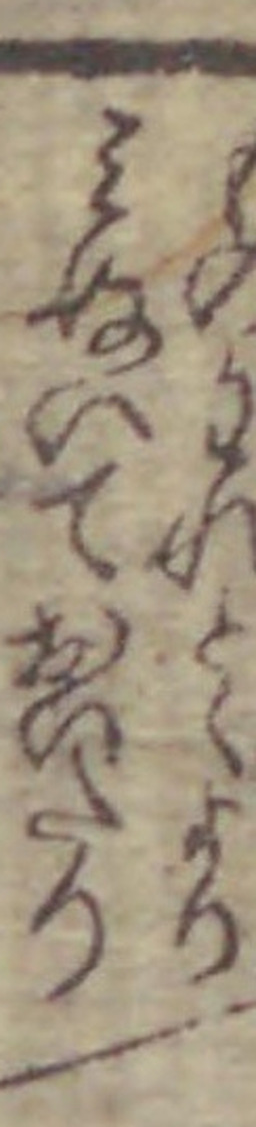みぬいておいたり
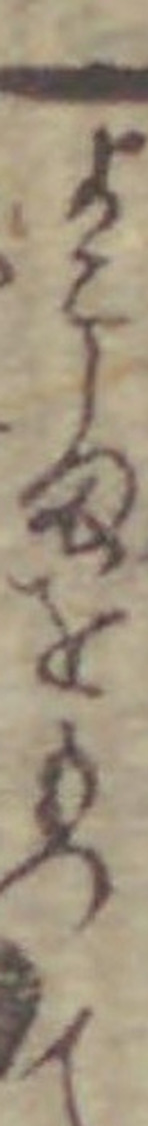よこしまをもつて
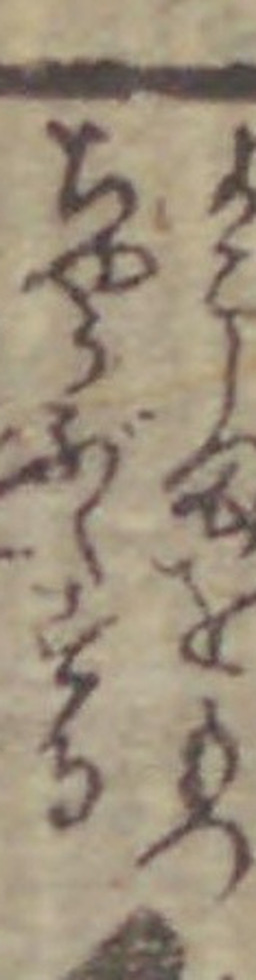ちやうぶくする
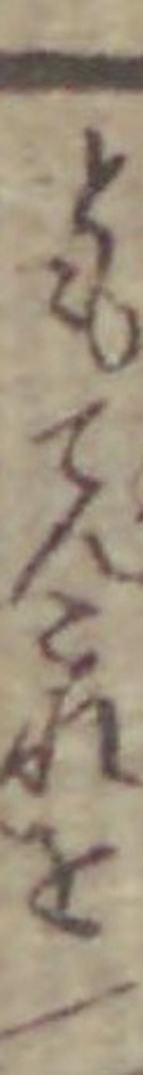ともてんこれを
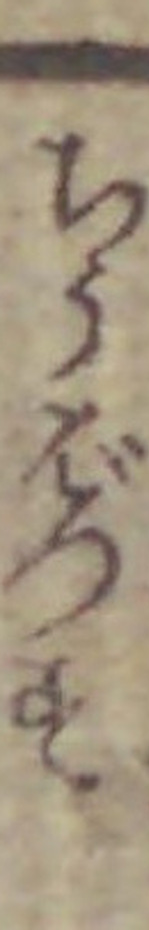ちうばつす
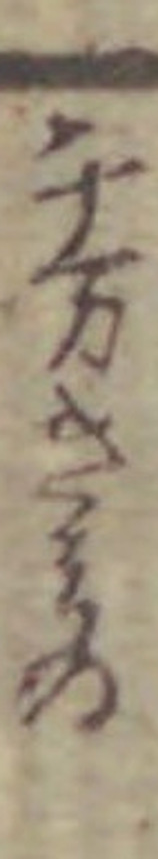千万きみの
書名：鎌倉山紅葉浮名
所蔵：国立国会図書館 National Diet Library, JAPAN
